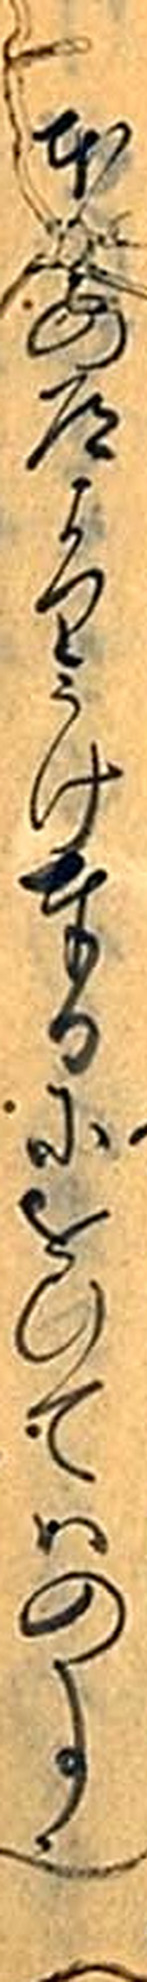本の道よりうけ奉るにをひてはの事也
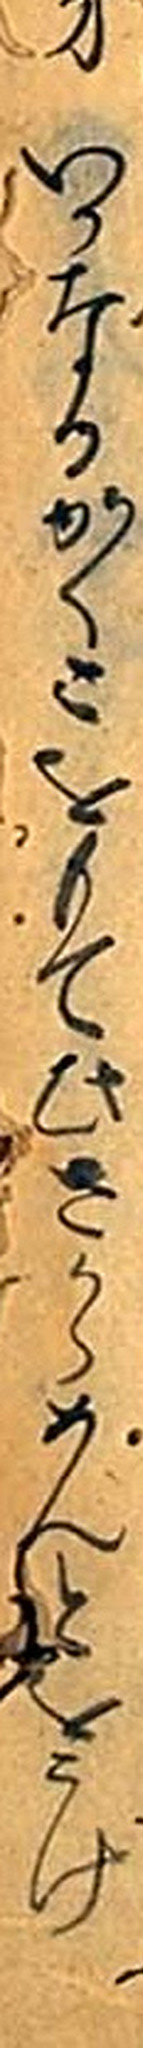弟いかなるかくこをもて此さからめんとをうけ

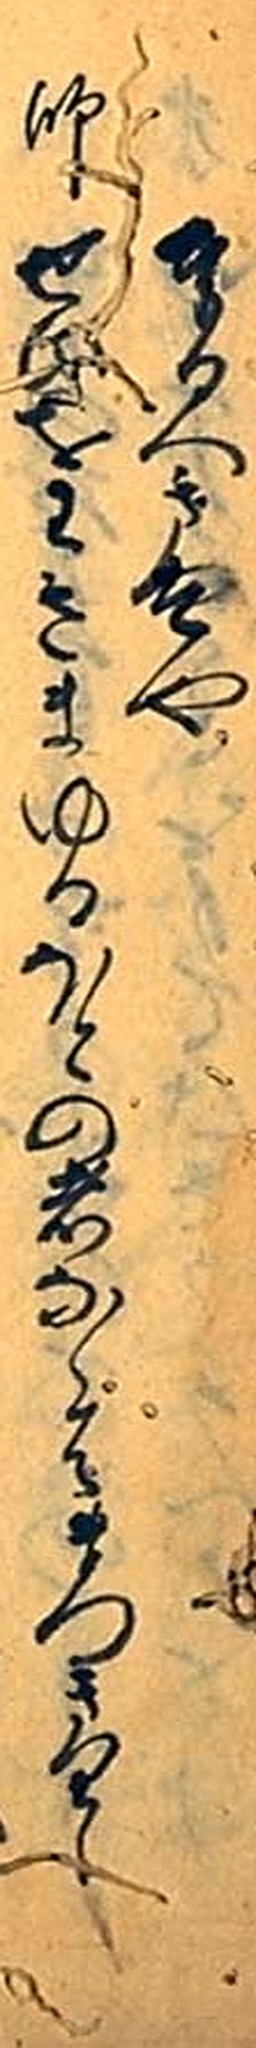師せをわきまゆるほとの者ならはまつきりし
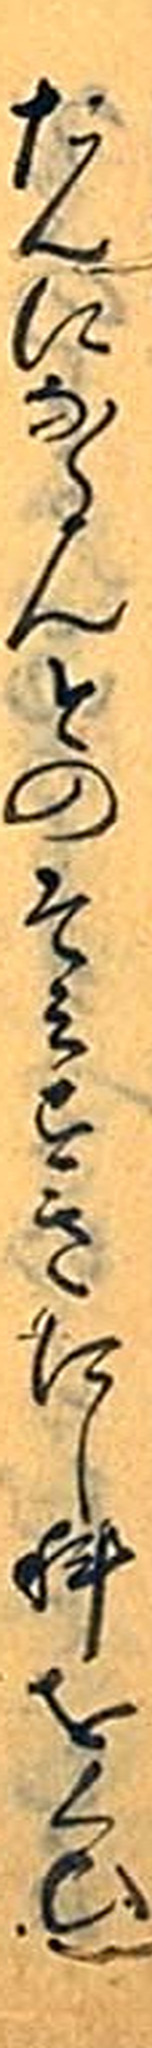たんにならんとのそみすきにし科をくひ
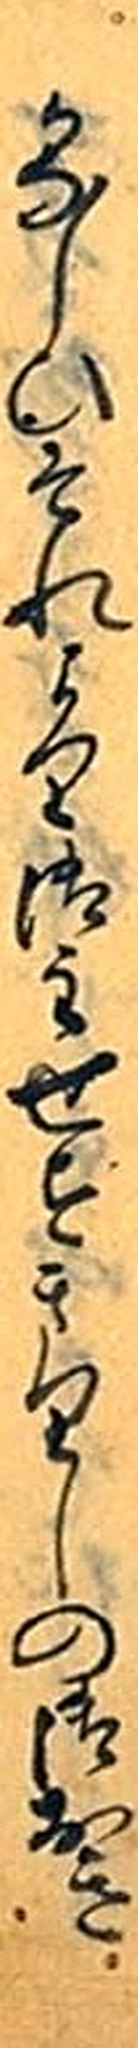かなしひそれより御主せすきりしの御おき
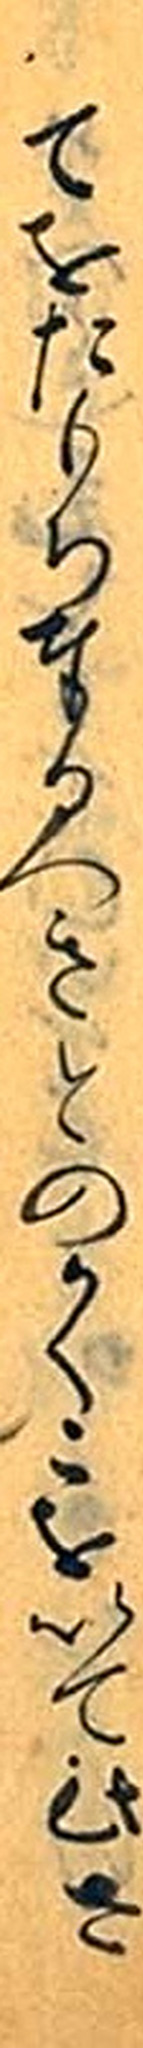てをたもち奉るへきとのかくこを以て此さ
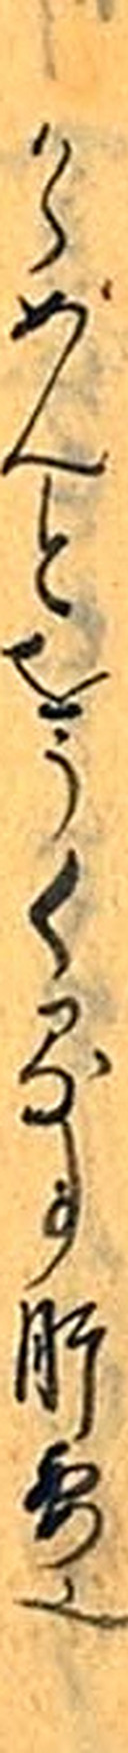からめんとをうくる事肝要也
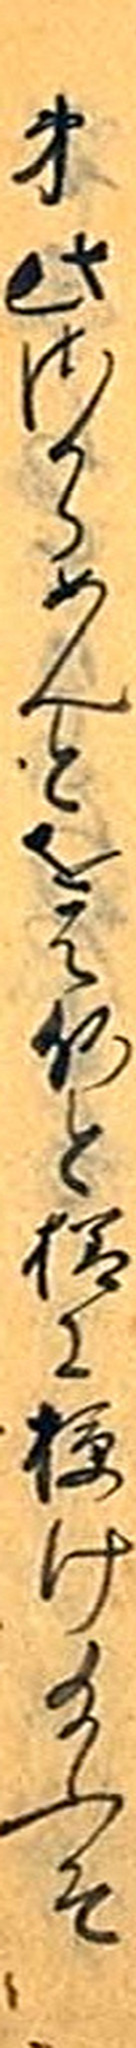弟此さからめんとをは何と様に授け給ふそ
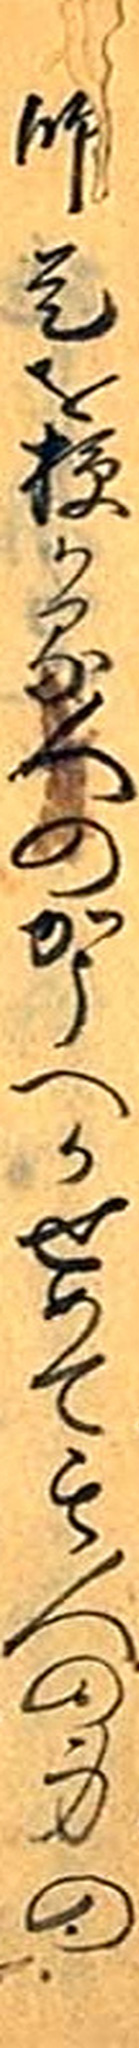師是を授かる人のかうへかせめて其人の身の
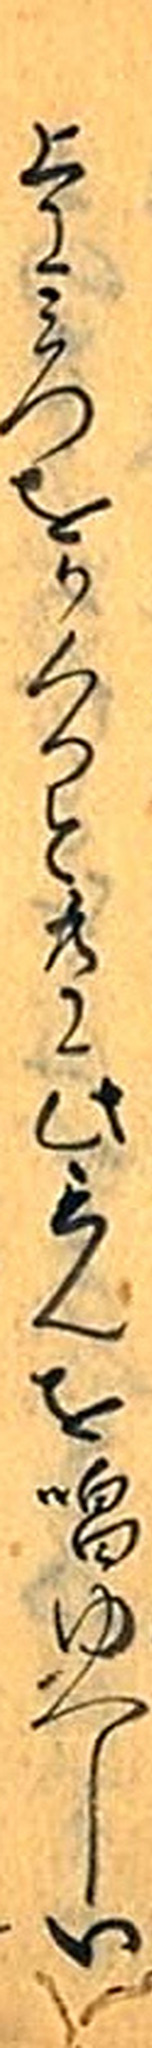上にみつをかくると共に此もんを唱ゆへしい
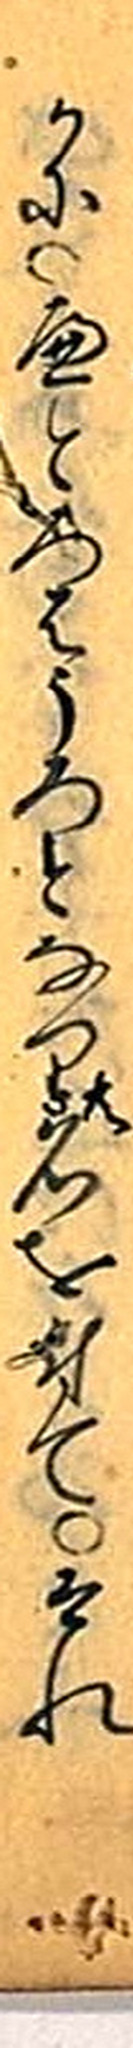かに○へとろはうろとなり共名を付て○それ
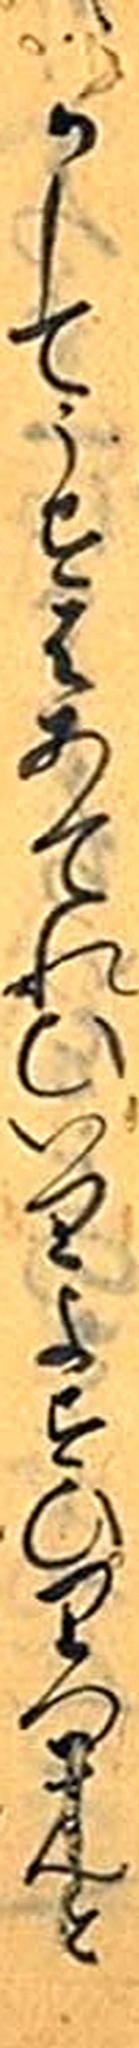かしてうすはあてれひいりよすひりつさんと
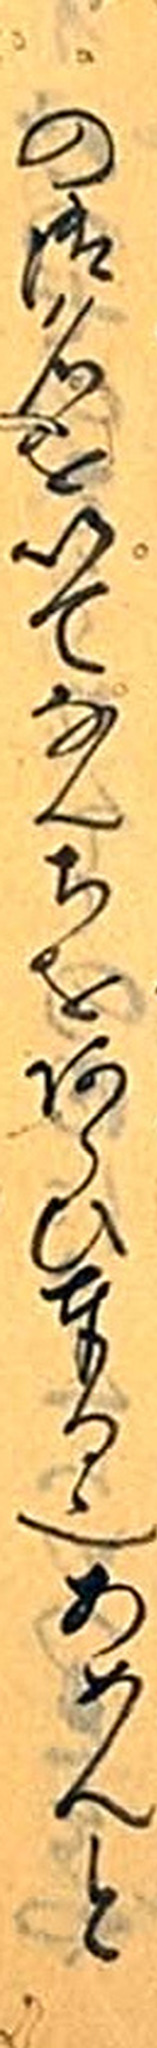の御名を以てなんちをあらひ奉る也あめんと
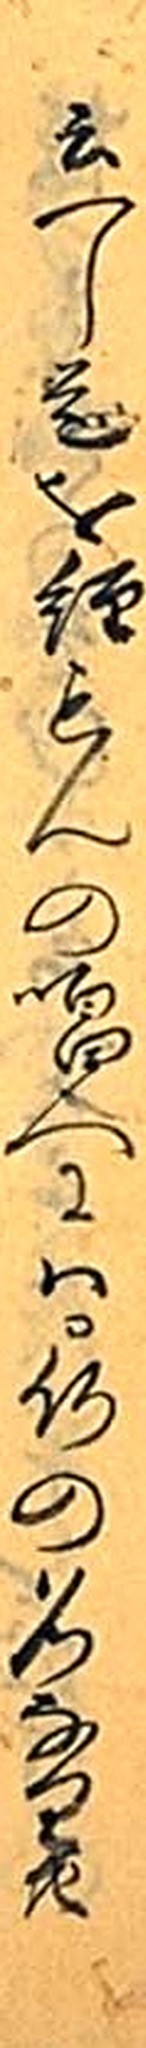云へし是を経もんの唱へには◦何の名なり共
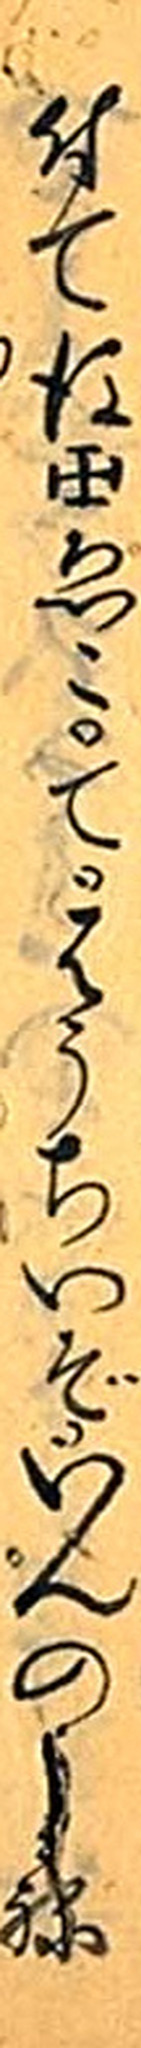付て後☩ゑこ◦て◦はうちいぞ◦いんのね
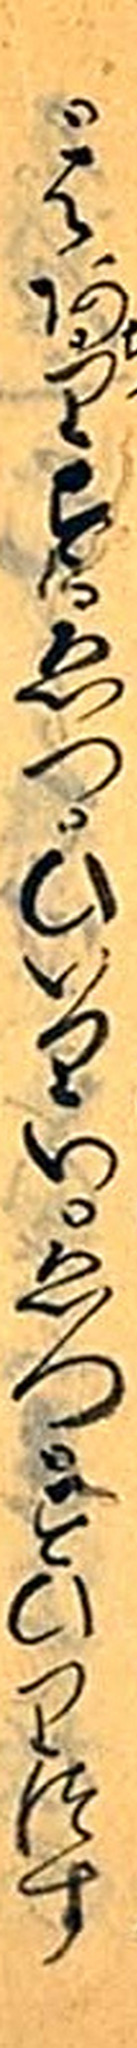◦はあちりす◦ゑつ◦ひいりい◦ゑつ◦すひりつす
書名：ドチリナ・キリシタン
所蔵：東京大学総合図書館 / General Library in the University of Tokyo
